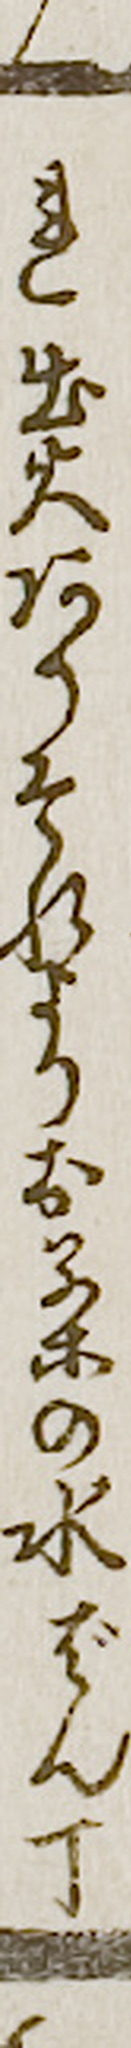れ出火ありそれよりお茶の水ばん丁
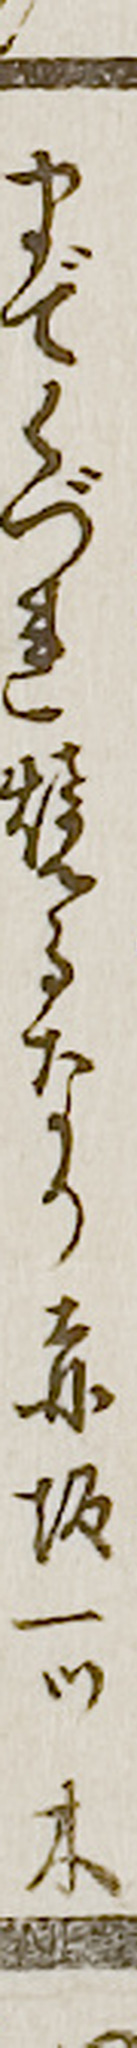までくづれ焼るなり赤坂一ツ木
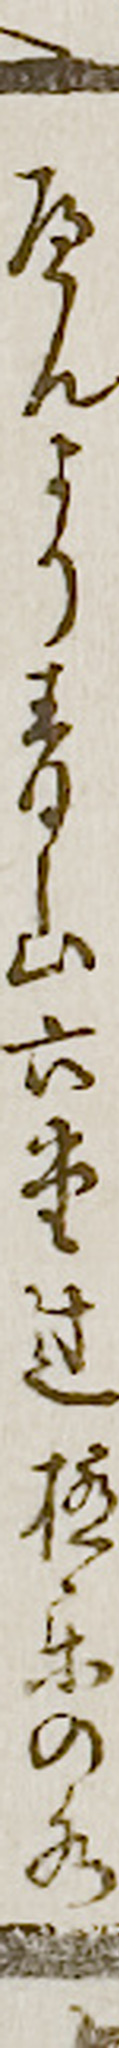へんより青山六堂辻極楽の水
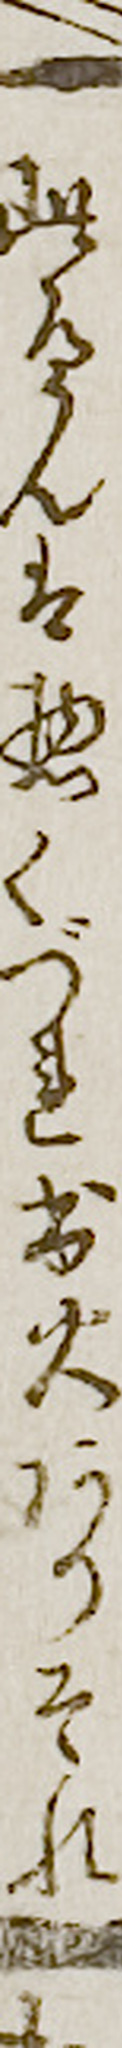此へんは惣くづれ出火ありそれ
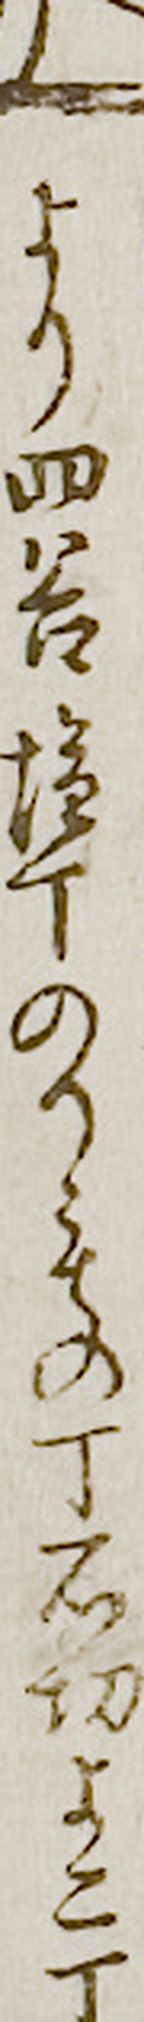より四谷塩丁のりもの丁石切よこ丁
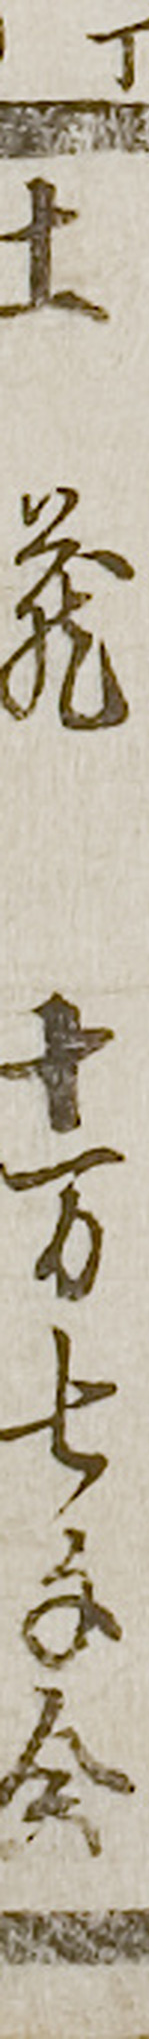土蔵十万七千余
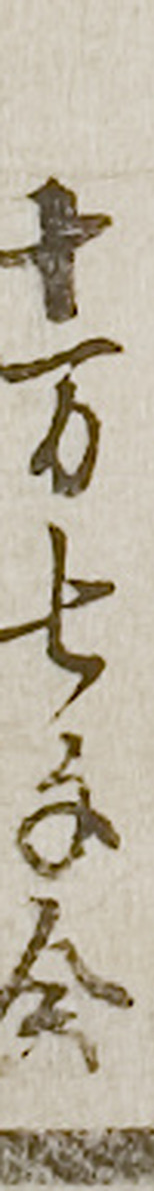土蔵十万七千余
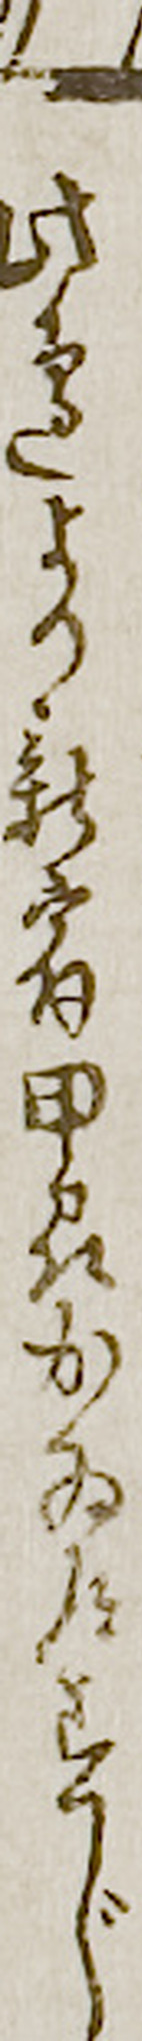此辺より新宿甲州かい道すじ
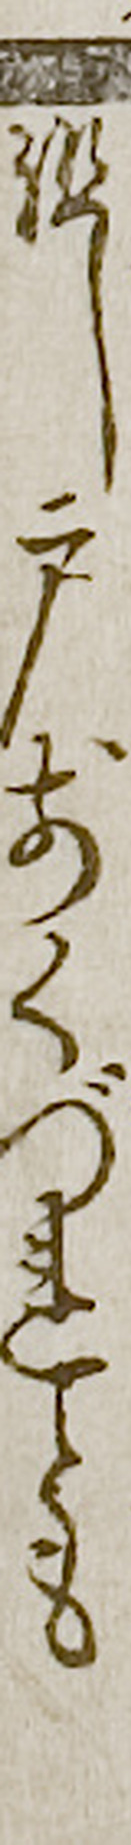但し戸前くづれとも
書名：安政二乙卯歳十月二日夜ル四ツ時震始メ末代
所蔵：東京大学総合図書館 General Library in the University of Tokyo, JAPAN
